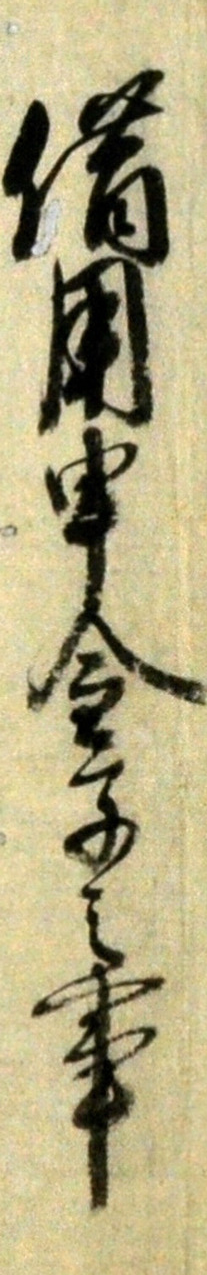借用申金子之事
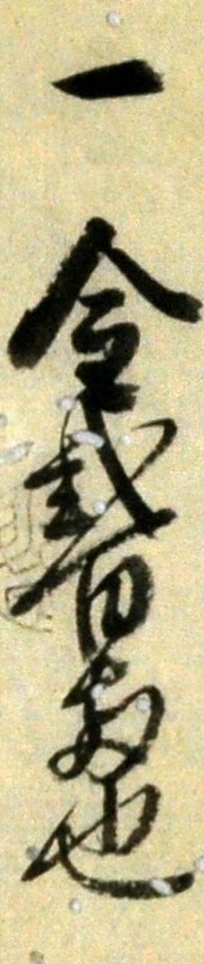一金弐百両也
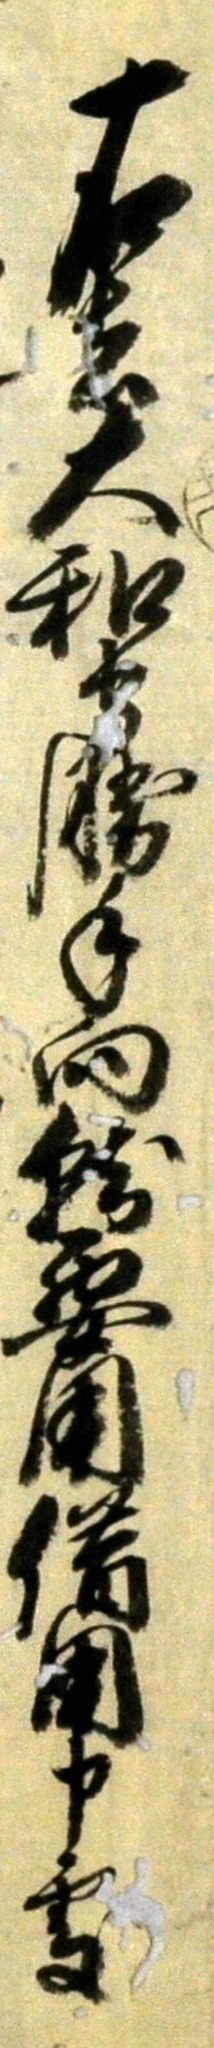右者大和守勝手向就要用借用申処
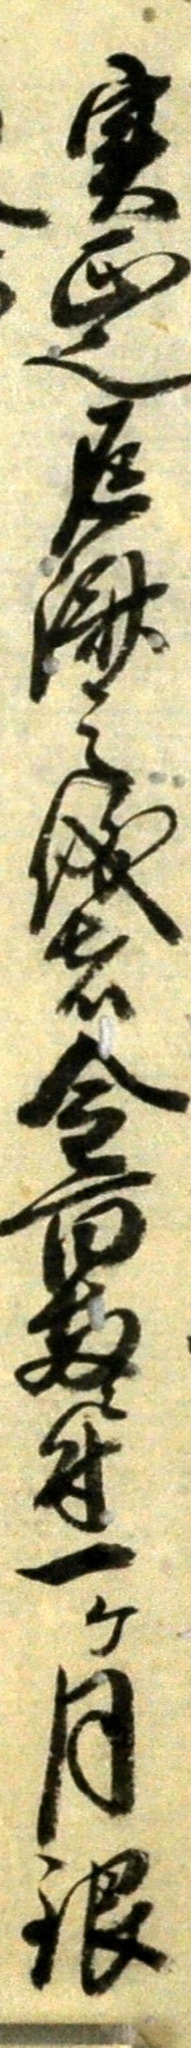実正也返済之儀者金百両ニ付一ヶ月銀
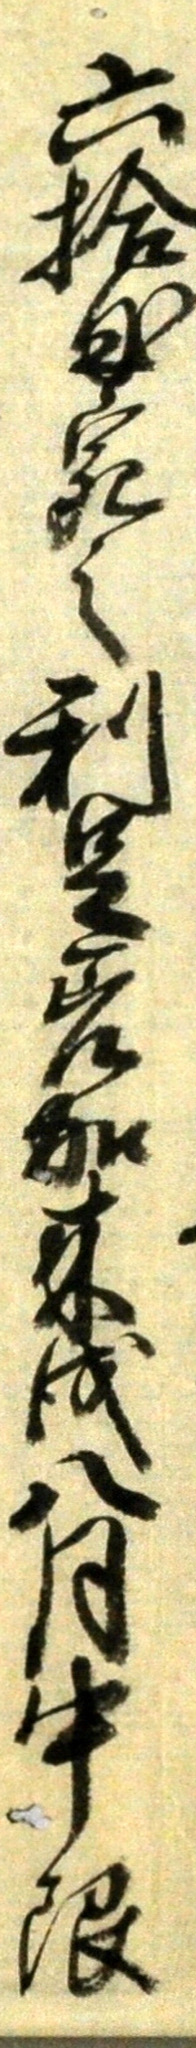六拾匁宛之利足差加来戌八月中限
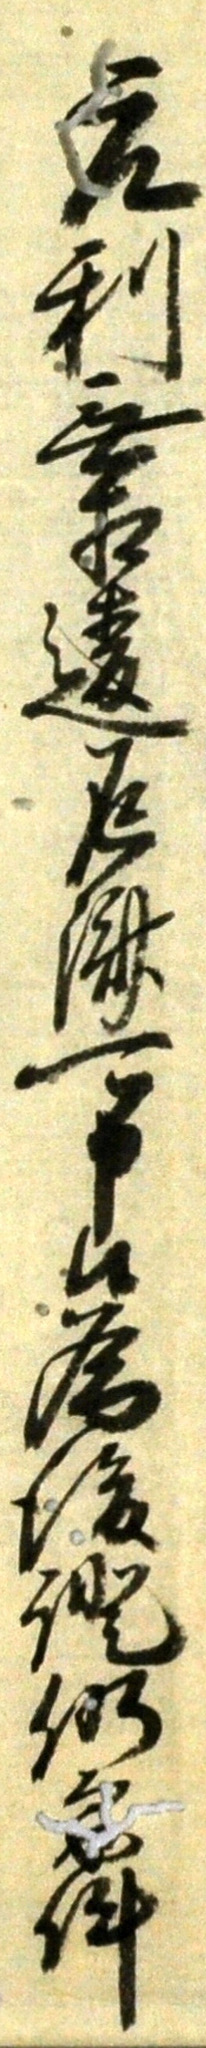元利無相違返済可申候為後証仍如件
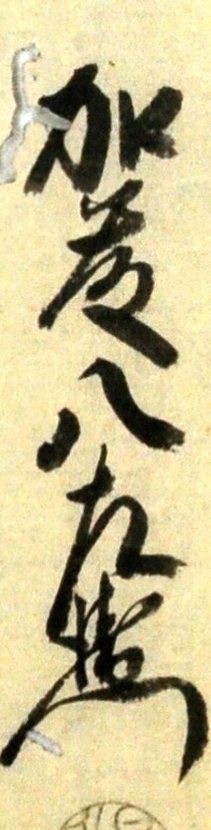加藤八左衛門㊞
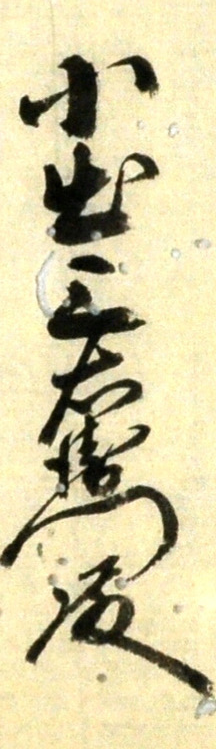小出三右衛門殿
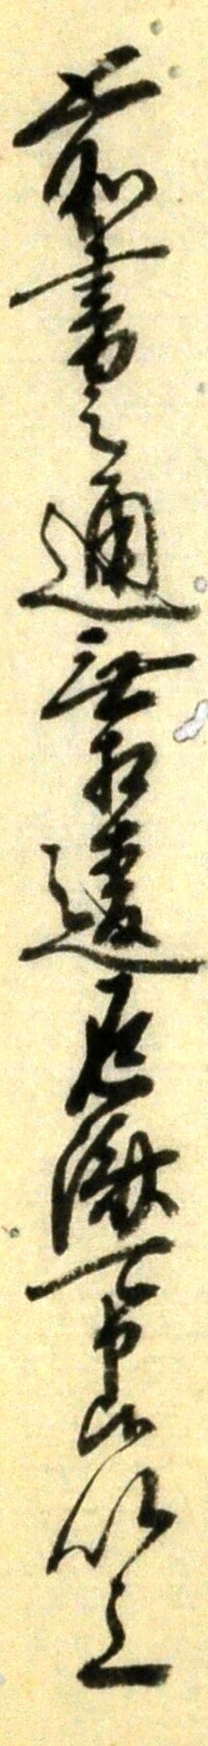前書之通無相違返済可申候以上
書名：借用申金子之事
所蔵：伊那市立高遠町図書館・合同会社AMANE
